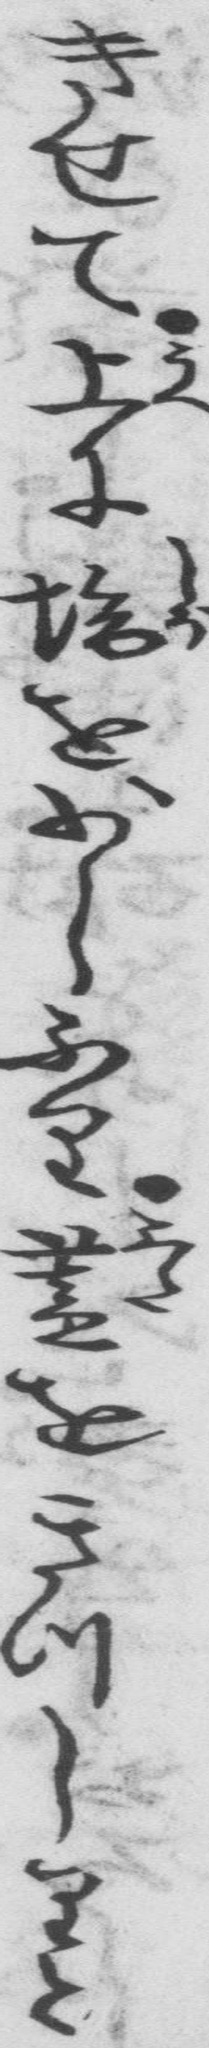きせて。上に塩を少しふり。蓋をきつしりと
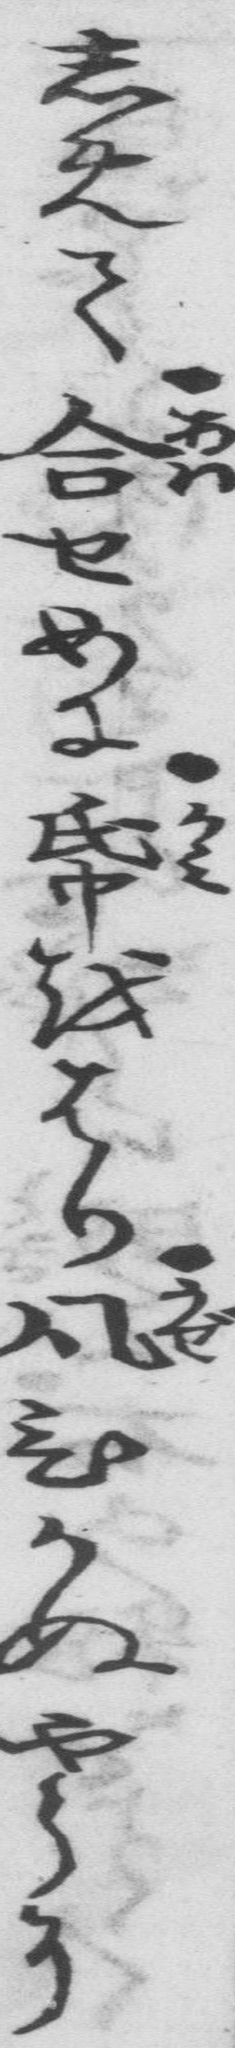しめて。合せめに。紙をはり。風ひかぬやうに
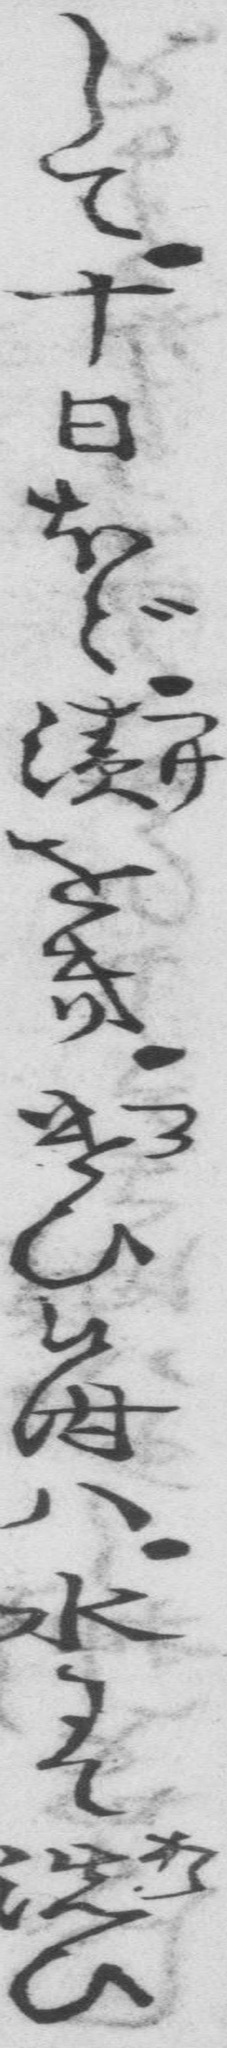して。十日ほど。漬をき。遣ひ候時は。水にて洗ひ
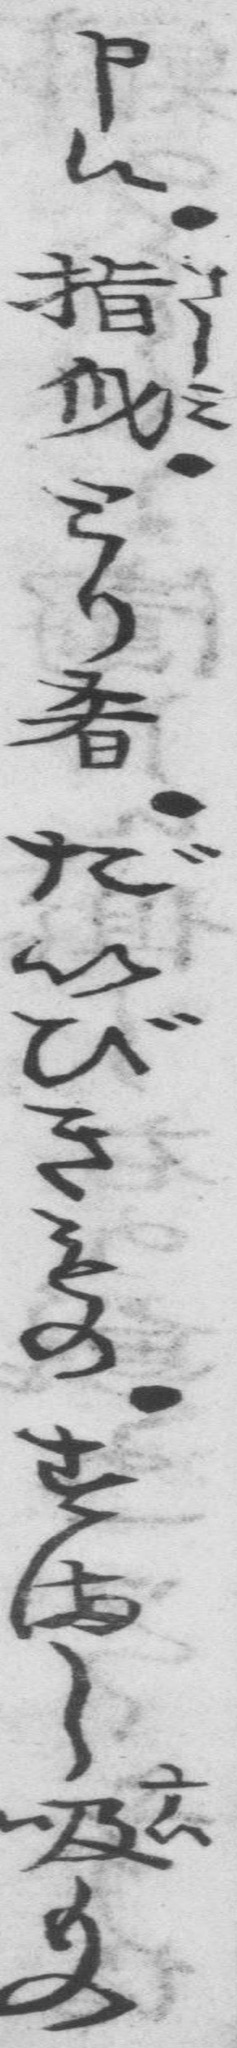申候。指身。とり肴。だいびきもの。すまし吸もの
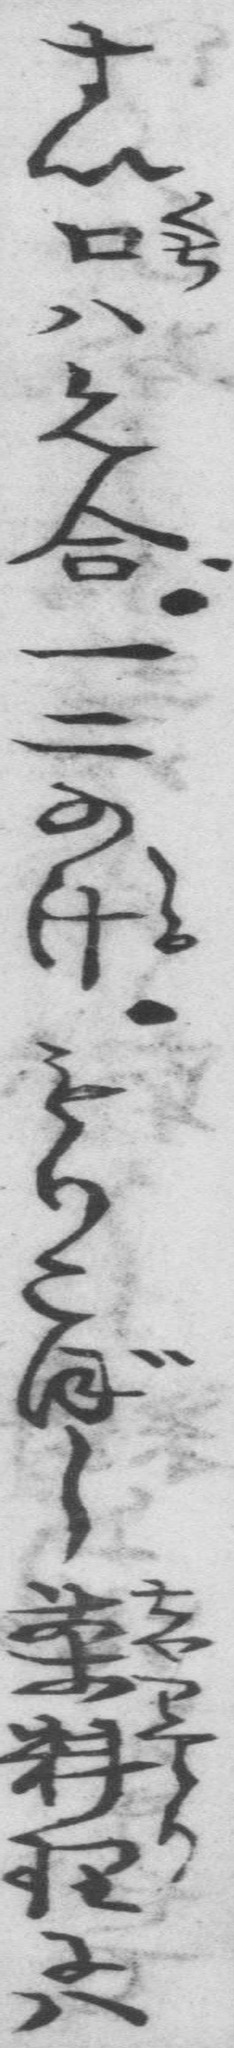すい口は見合。一二の汁。もりこぼし茶料理には
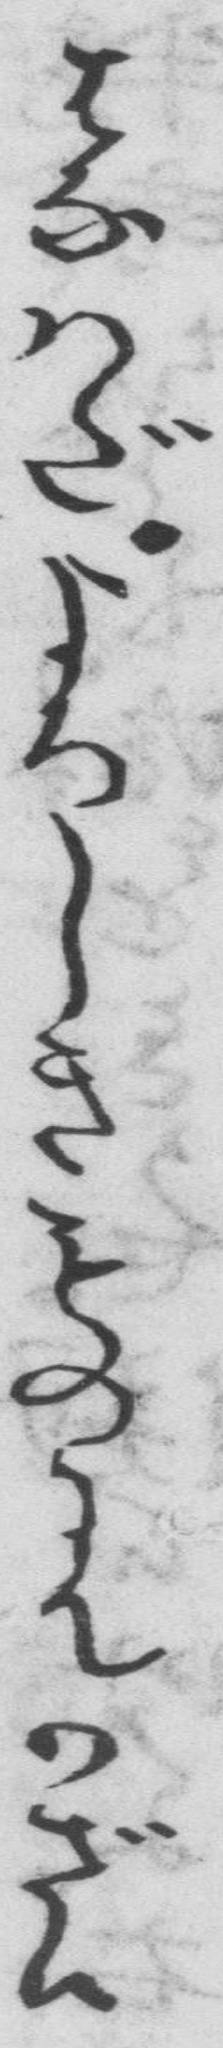はなはだ。よろしきものにて御ざ候
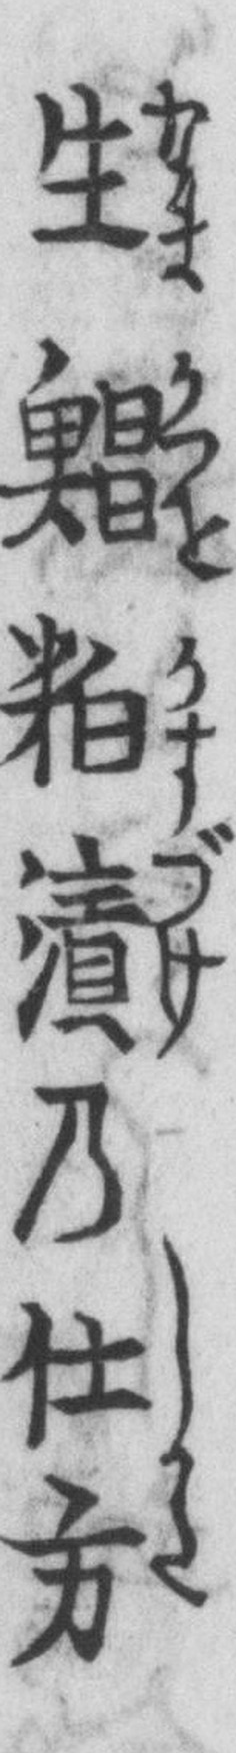生鯧粕漬の仕方

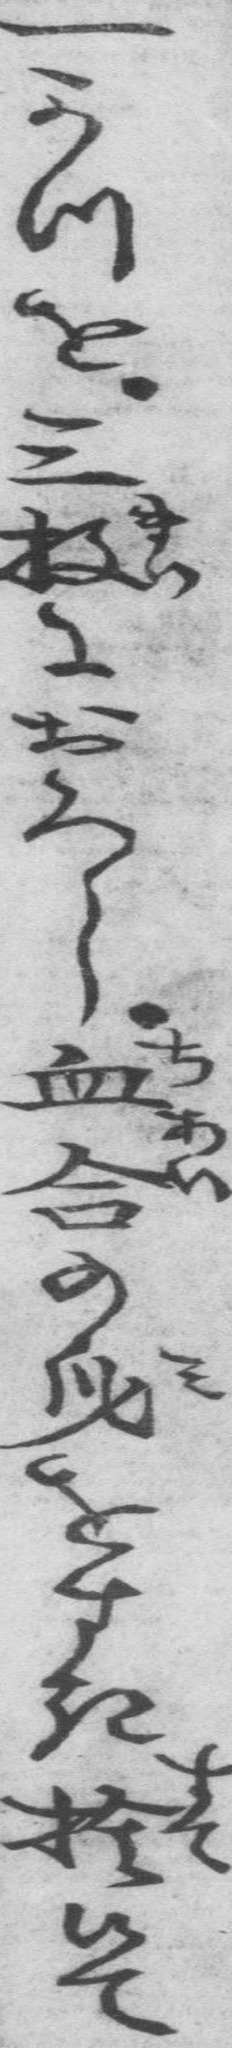一かつを。三枚におろし。血合の身をすき捨候て
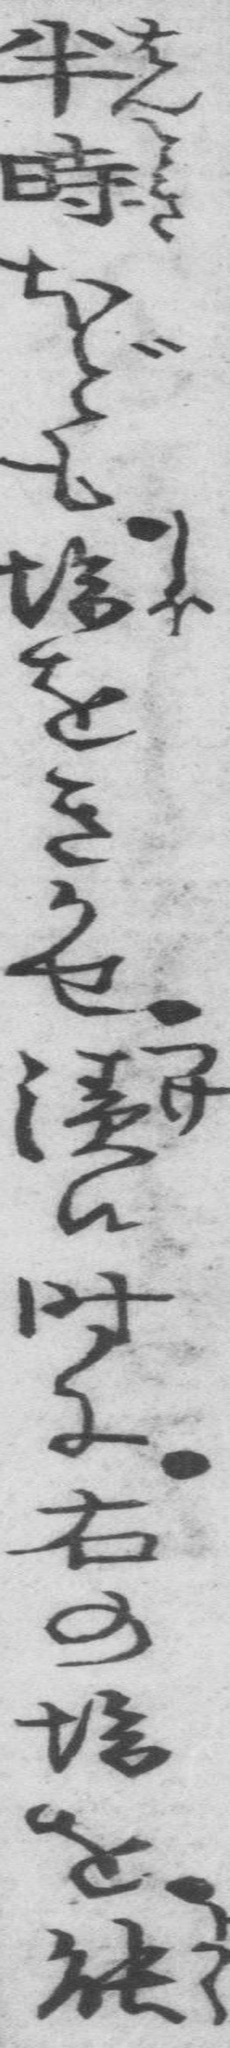半時ほども。塩をきかせ。漬候時に。右の塩を。能
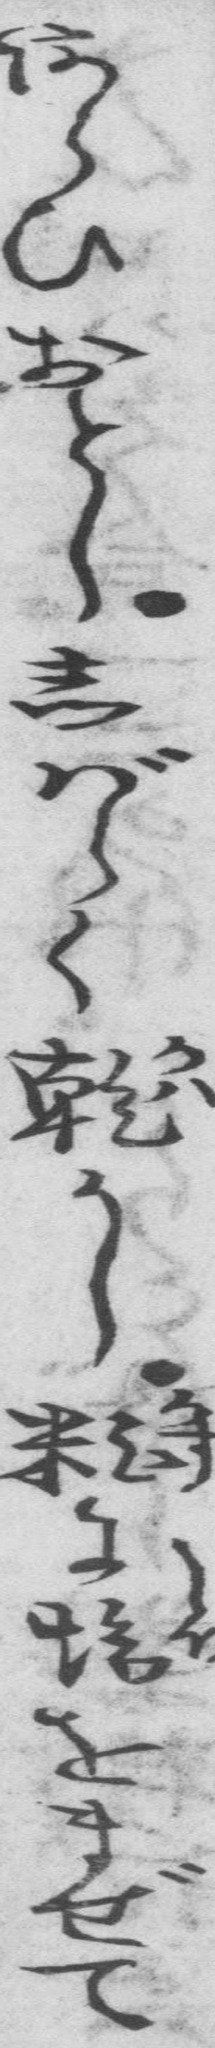あらひおとし。しばらく乾かし。粕に塩をまぜて
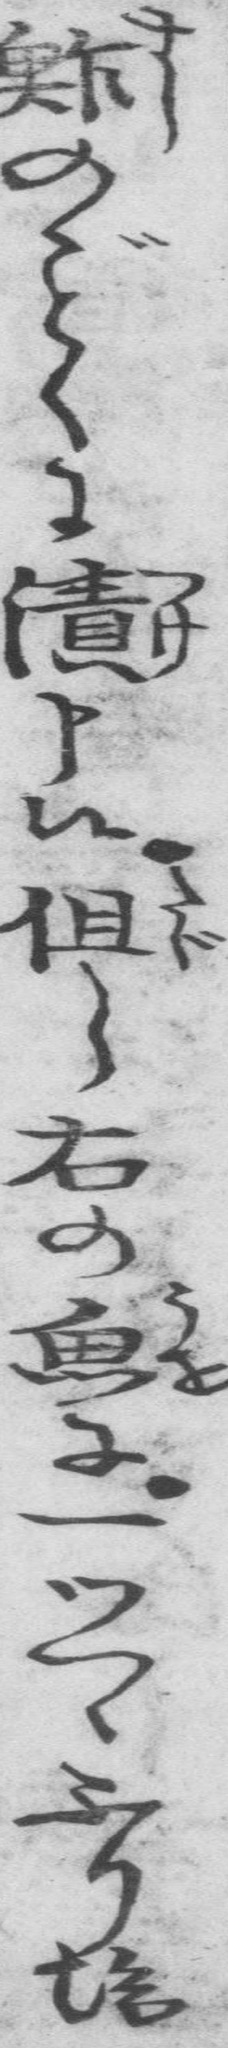鮓のごとくに漬申候。但し右の魚に。一ツつゝふり塩
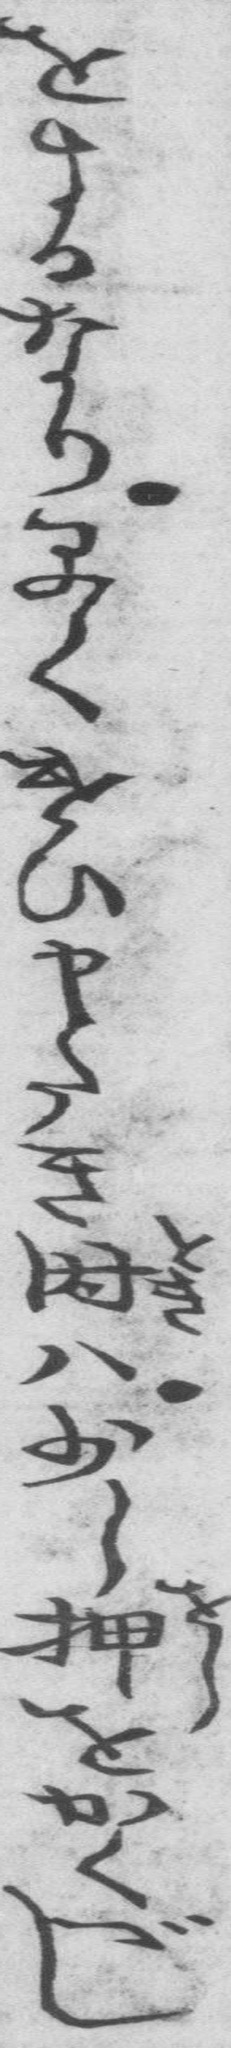をするなり。早く遣ひ申たき時は。少し押をかくべし
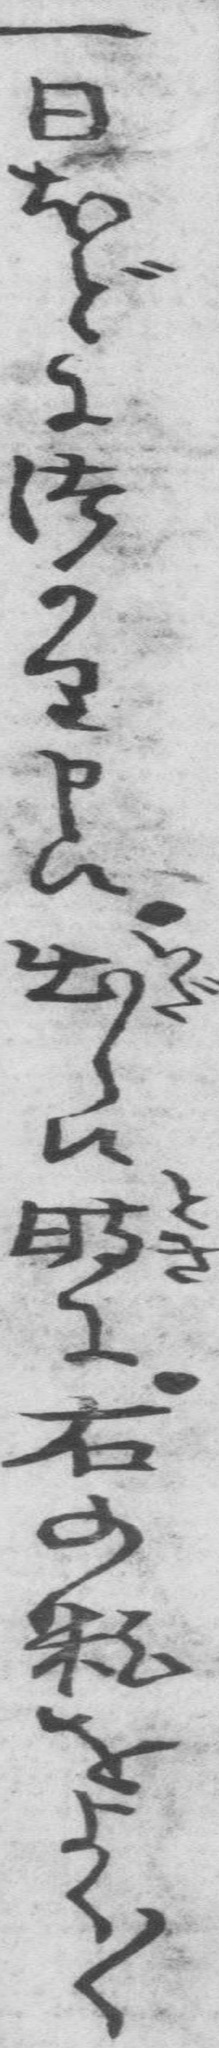一日ほどにつかり申候。出し候時に。右の粕をよく〳〵
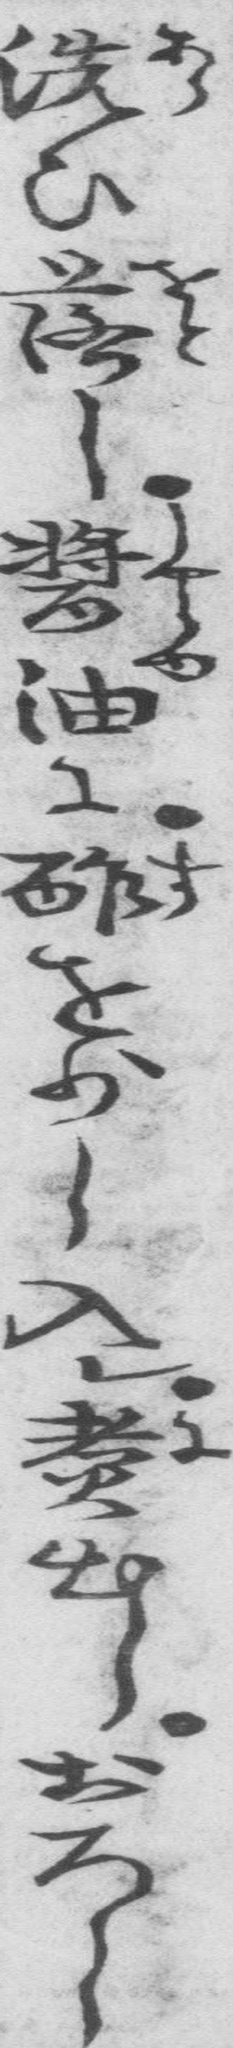洗ひ落し。醤油に。酢を少し入れ。煮出し。おろし
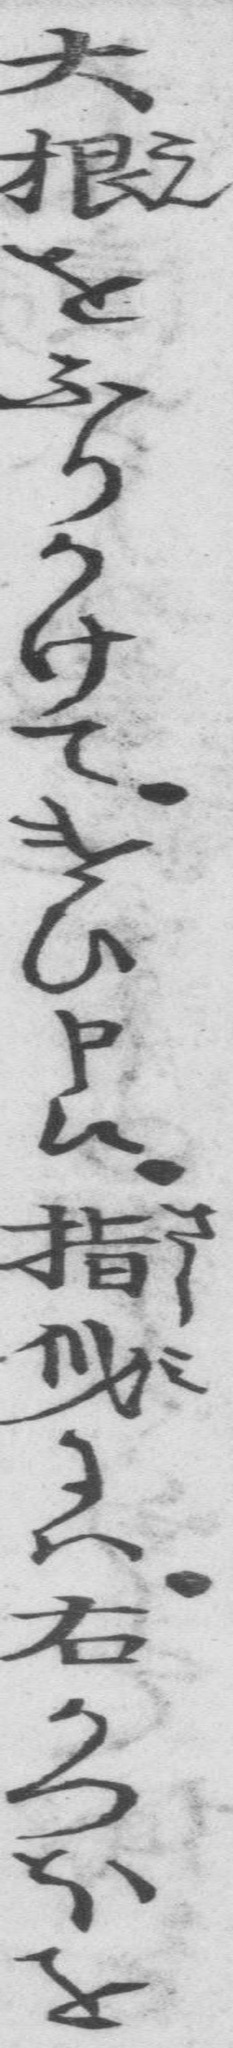大根をふりかけて。遣ひ申候。。指身には。右かつほを
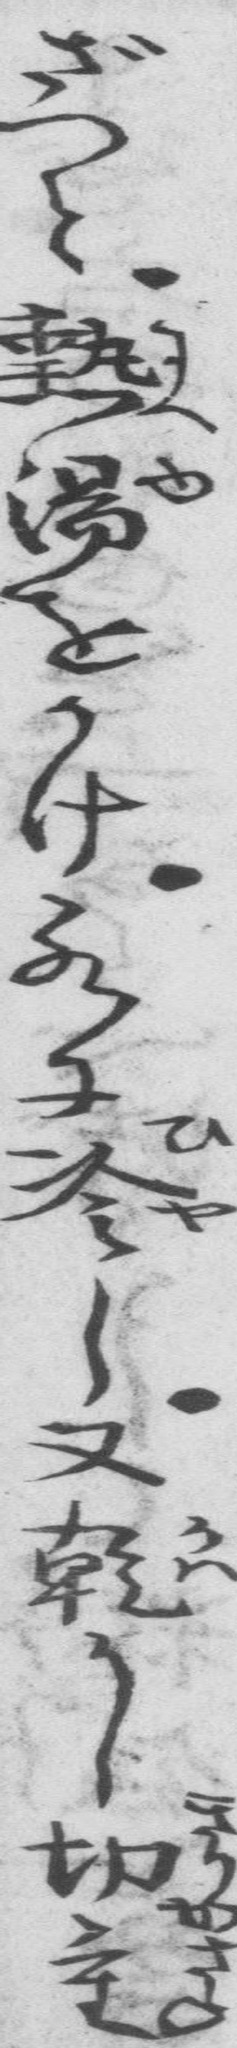ざつと。熱湯をかけ。水に冷し。又乾かし切重
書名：萬寳料理秘密箱
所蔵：大阪府立大学学術情報センター 国文学研究資料館
